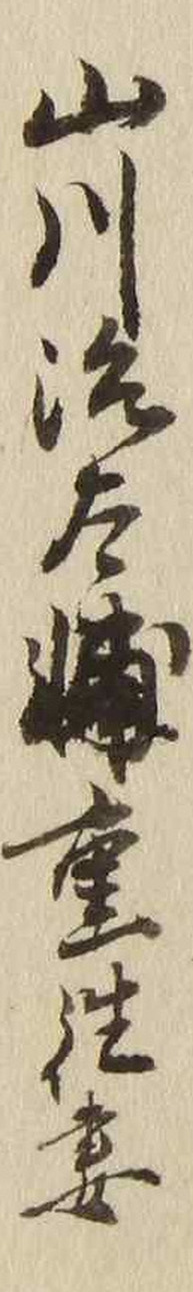女山川治太輔重往妻
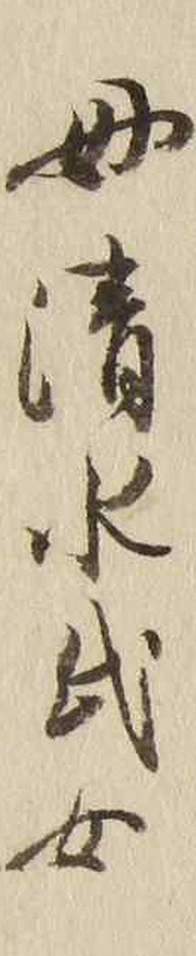母清水氏女

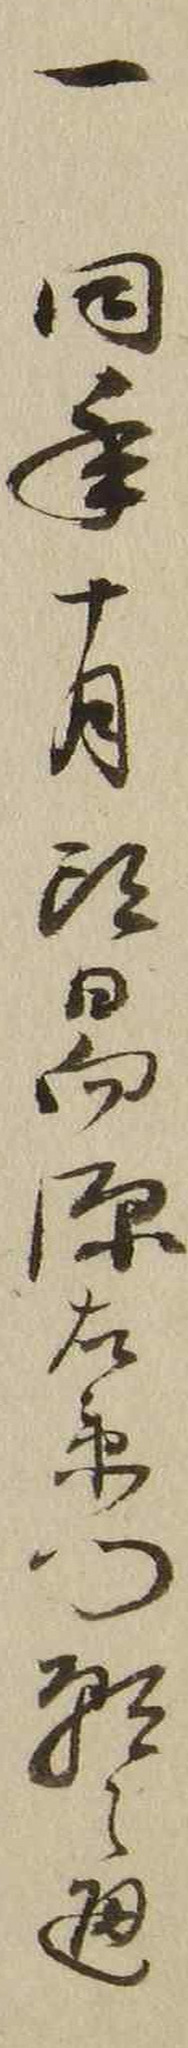一同年十月頭日向源右衛門願之通
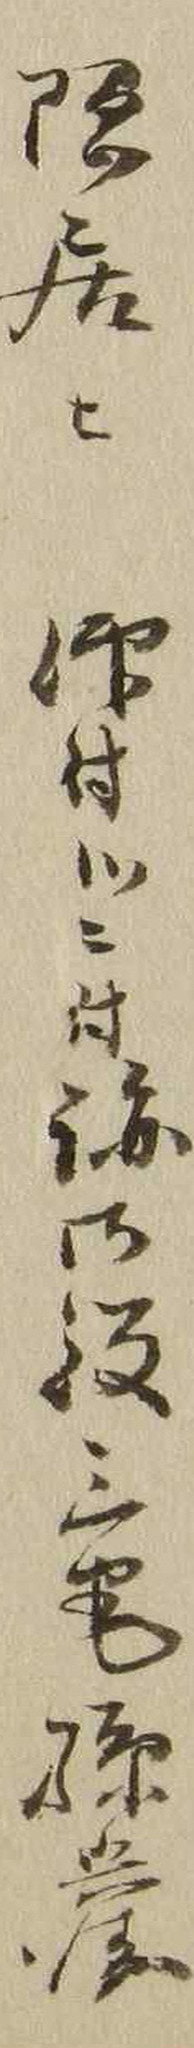隠居被仰付候ニ付跡御役三宅孫兵衛
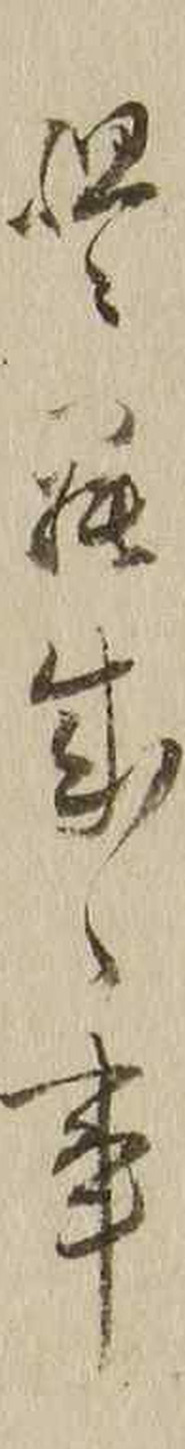組ニ罷成候事
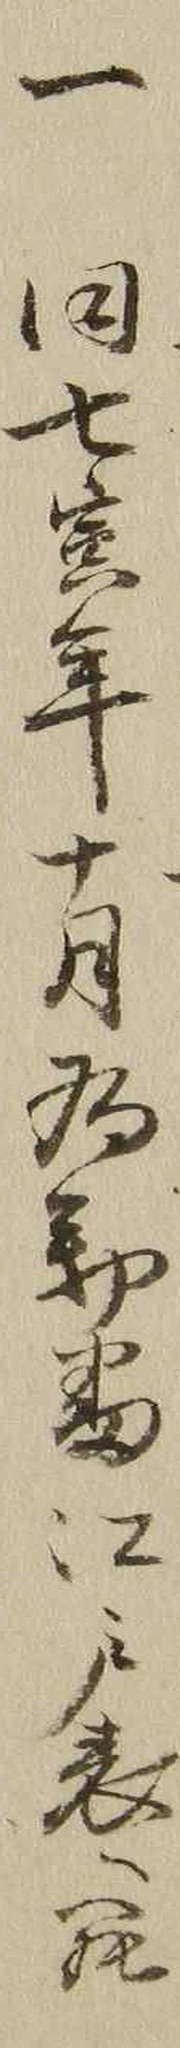一同七寅年十月為勤番江戸表へ罷
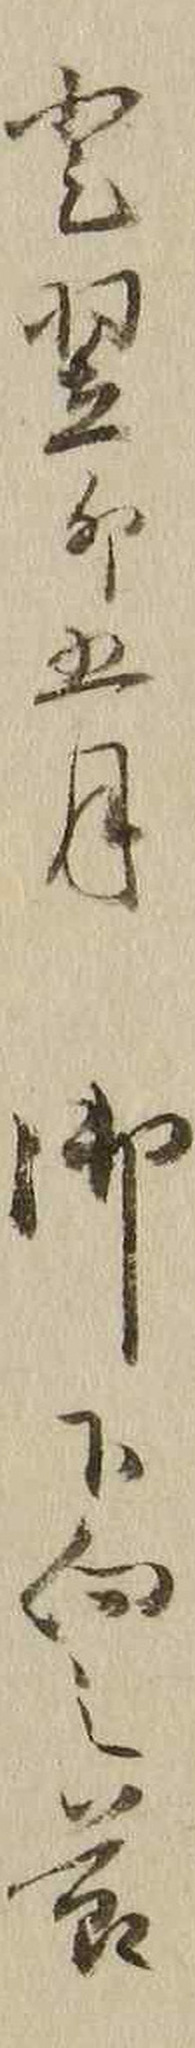登翌卯五月御下向之節
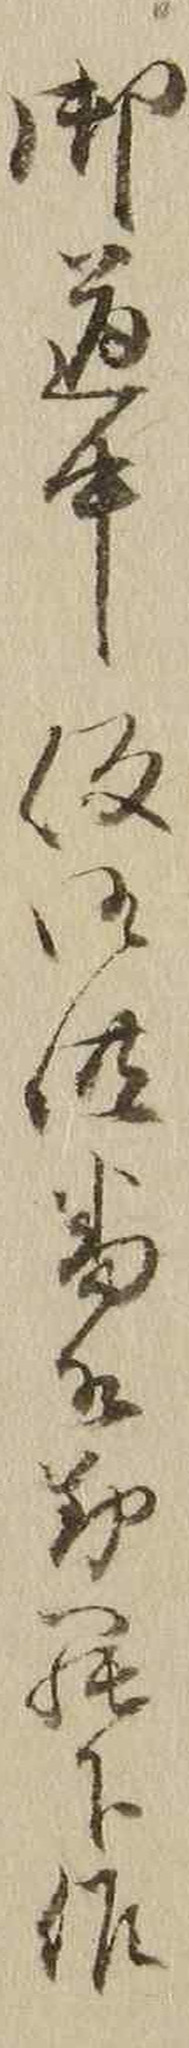御道中仮御供番相勤罷下候
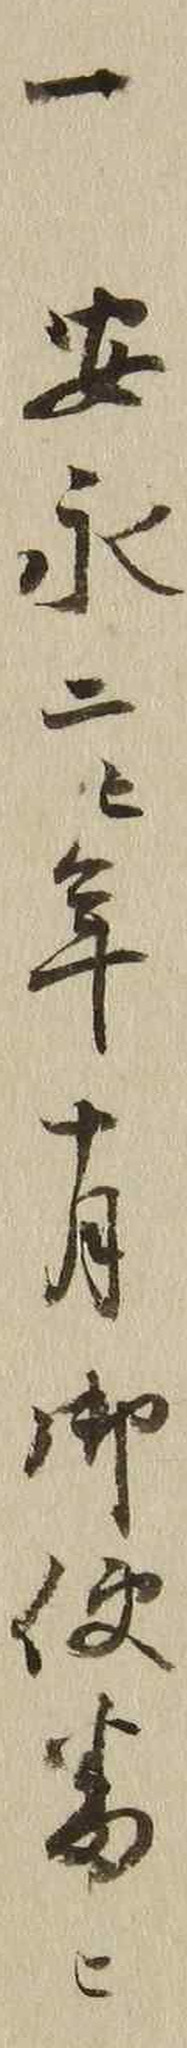一安永二巳年十月御使番被
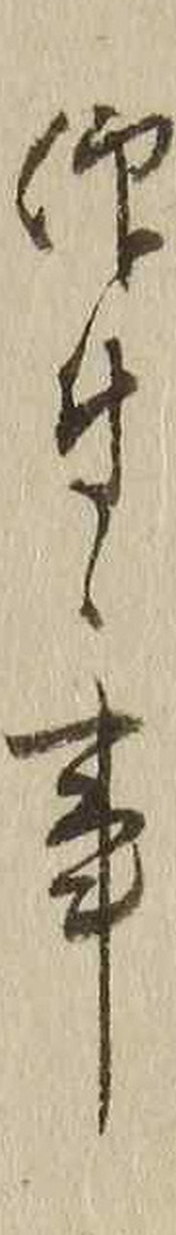仰付候事
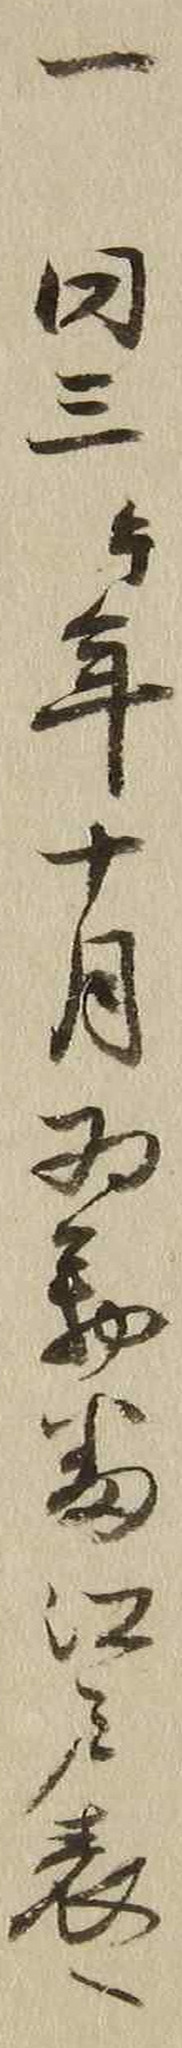一同三午年十月為勤番江戸表へ
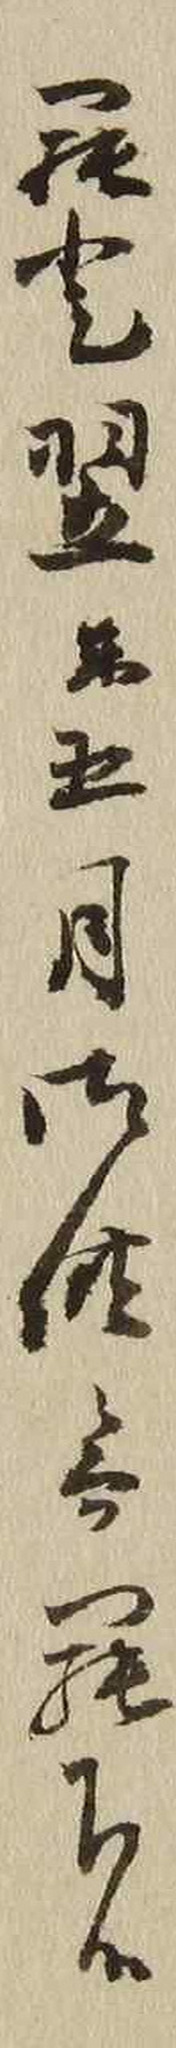罷登翌未五月御供ニ而罷下候
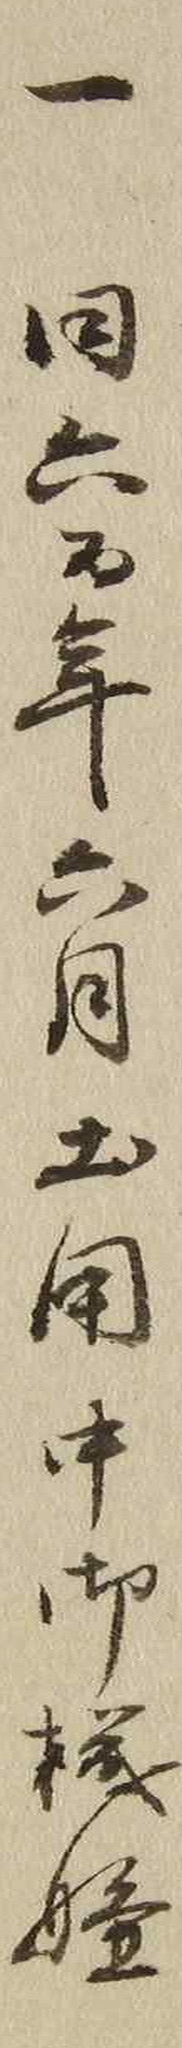一同六酉年六月土用中御機嫌
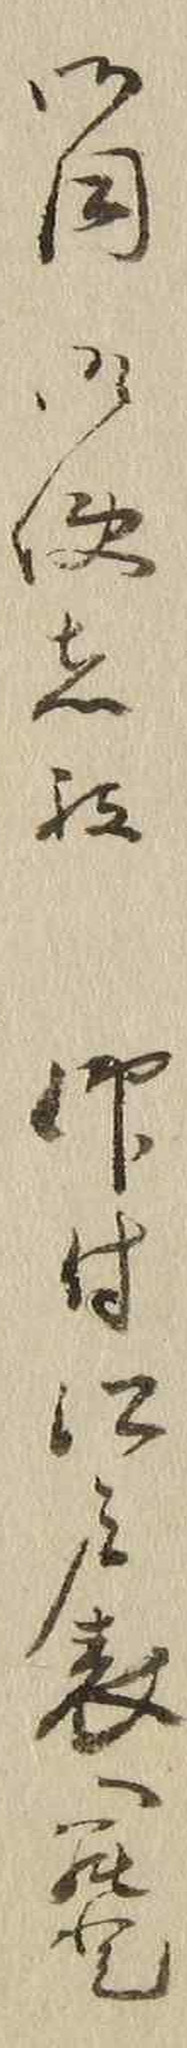御伺御使者被仰付江戸表へ罷登
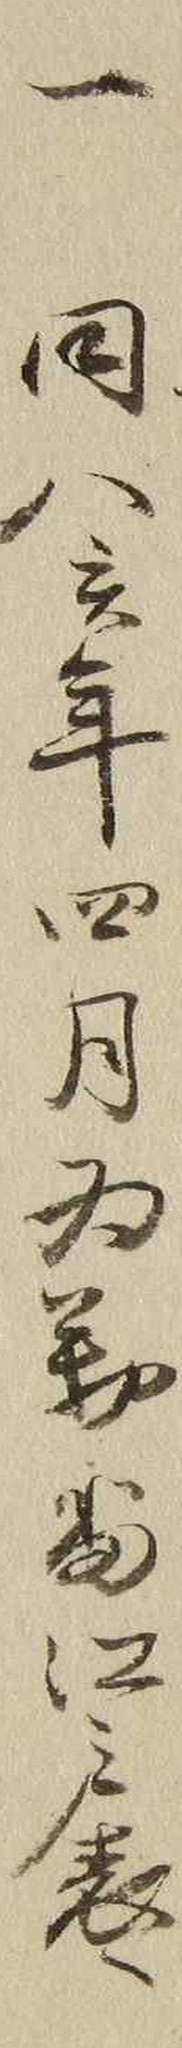一同八亥年四月為勤番江戸表へ
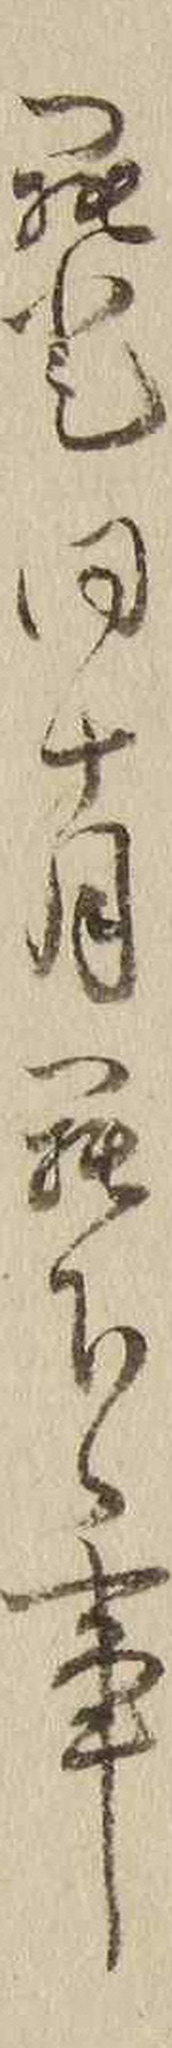罷登同十月罷下候事
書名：諸士系譜　巻之225　ま之部6
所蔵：会津若松市立会津図書館
